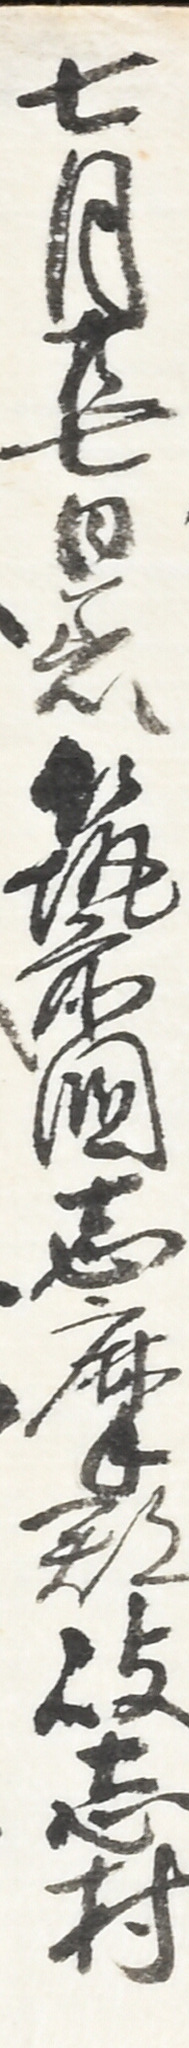七月廿七日着筑前国志摩郡岐志村
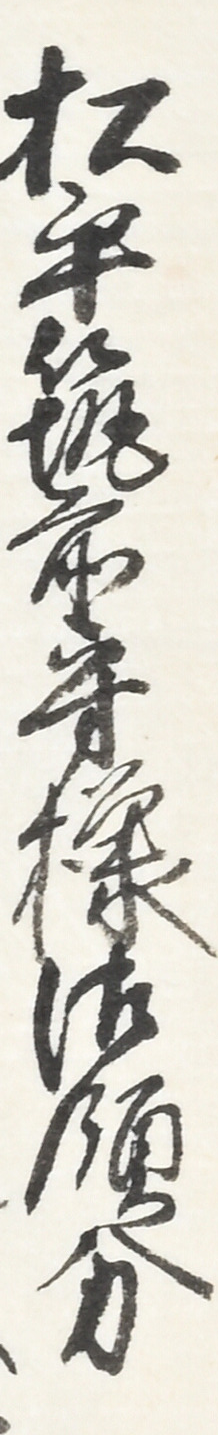松平筑前守様御領分
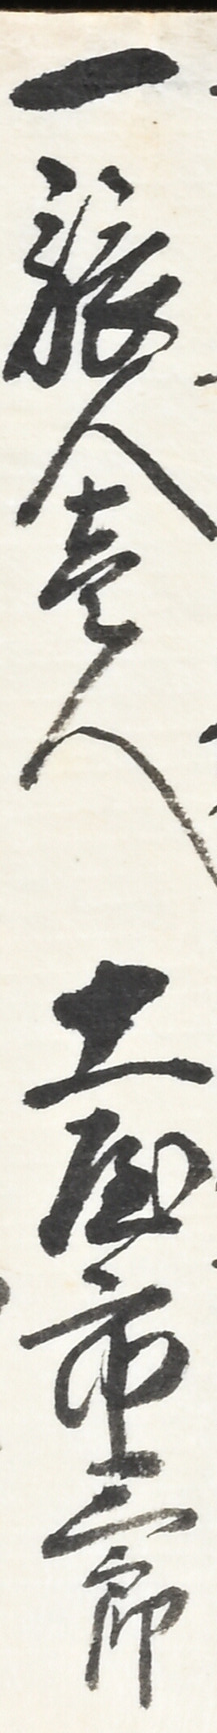一旅人壱人土屋市三郎
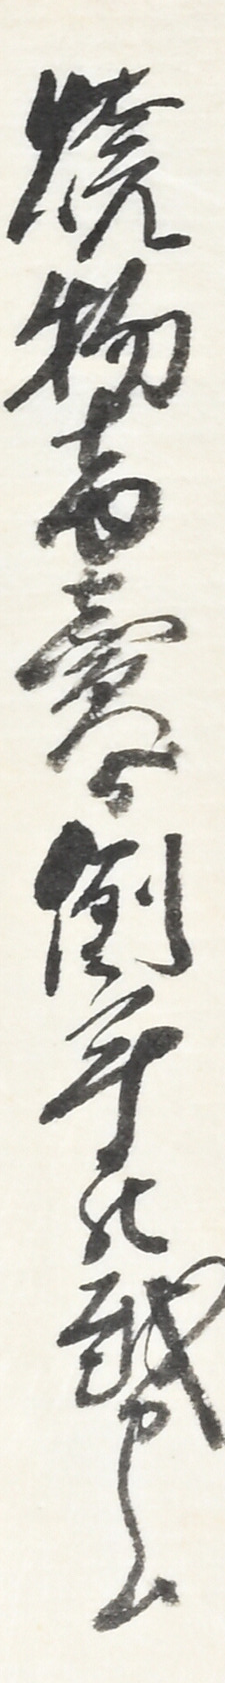焼物商売ニ而例年罷越申候
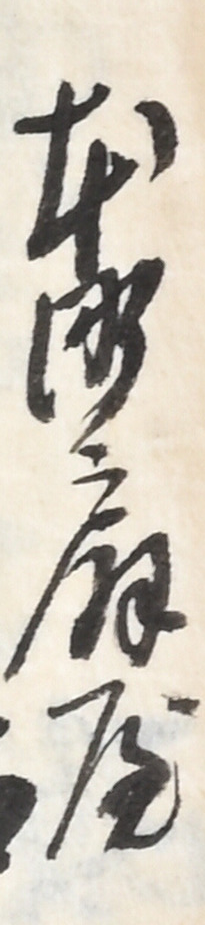本町扇屋
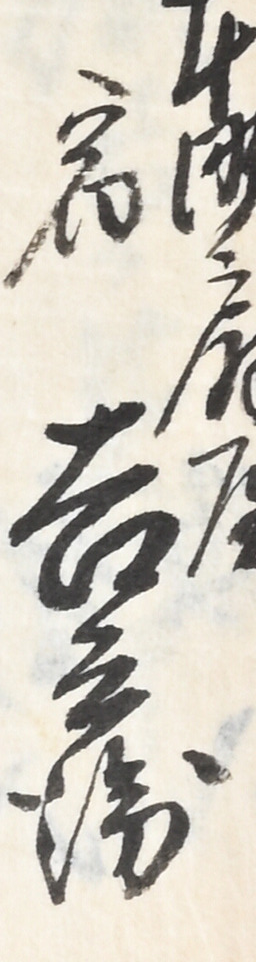宿吉兵衛

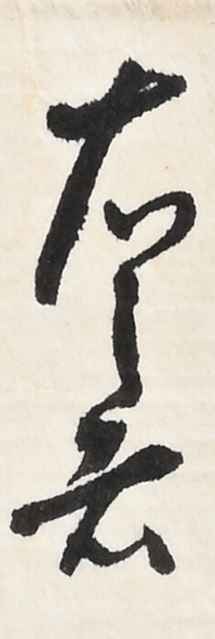右之者
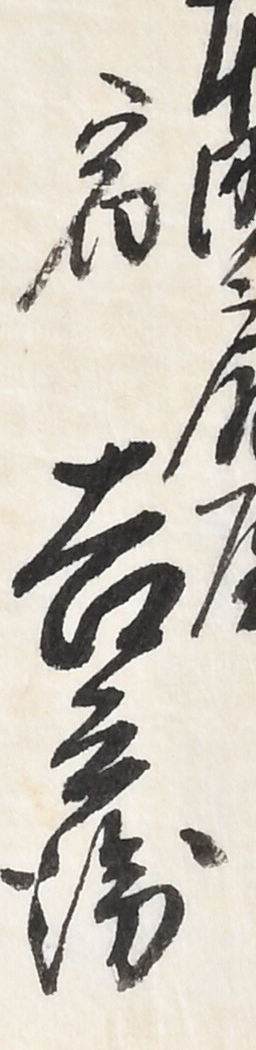宿吉兵衛
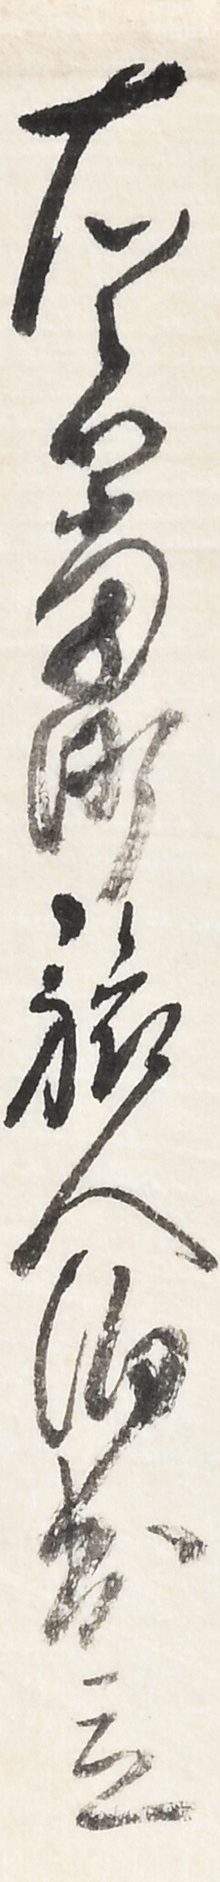右者当町旅人泊出立
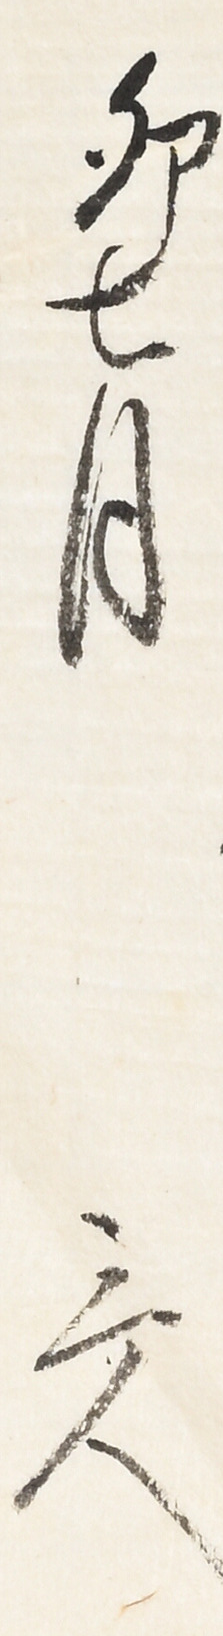卯七月三人
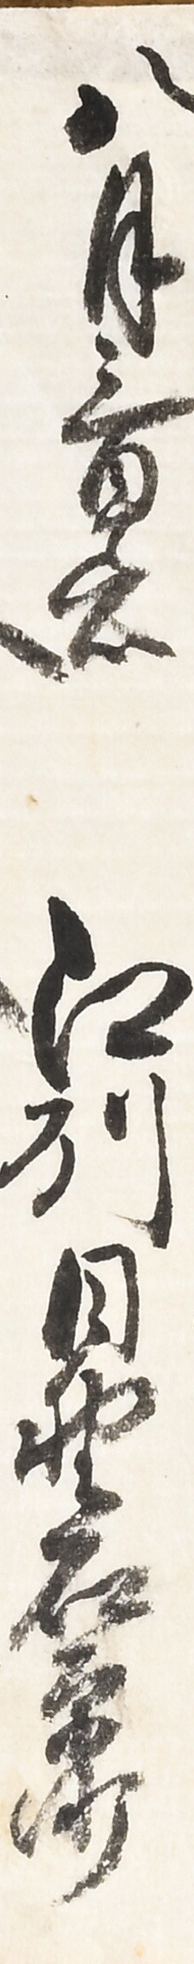八月三日着江州日野石原町
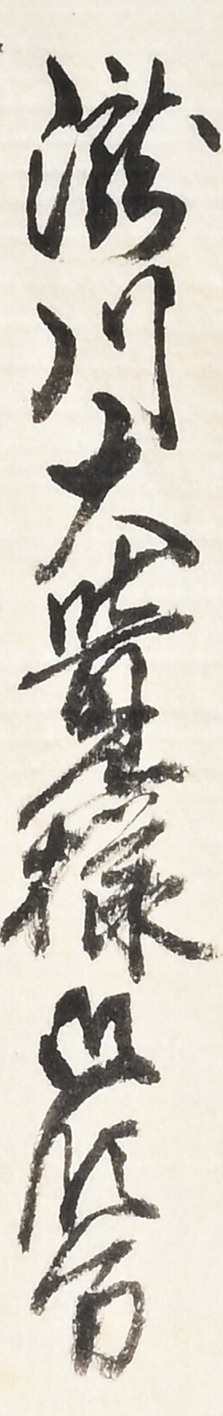瀧川大覚様御領分
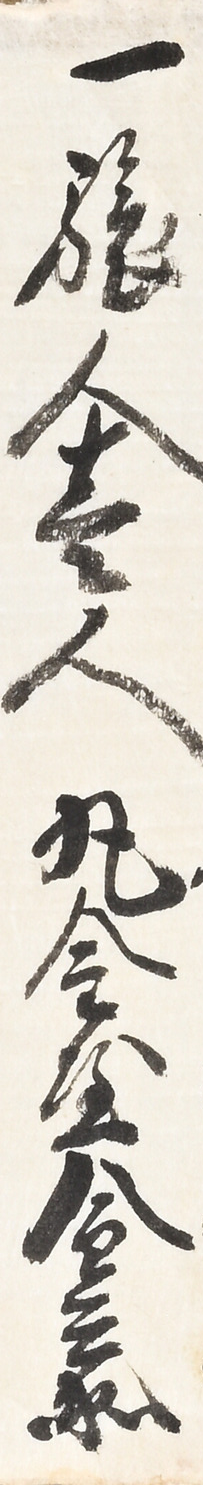一旅人壱人丸金屋金兵衛
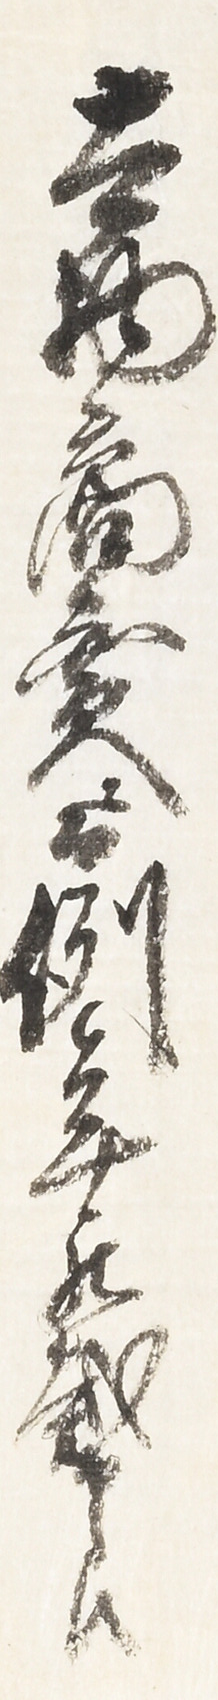太物商売ニ而例年罷越申候
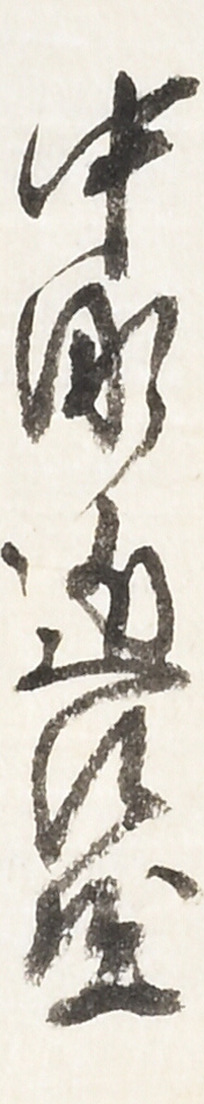中町近江屋
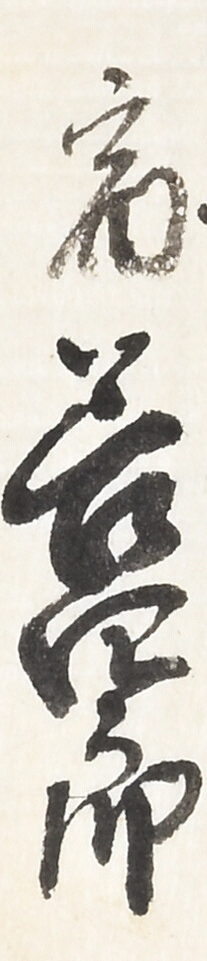宿善四郎
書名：旅人泊控帳
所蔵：伊那市立高遠町図書館・合同会社AMANE
